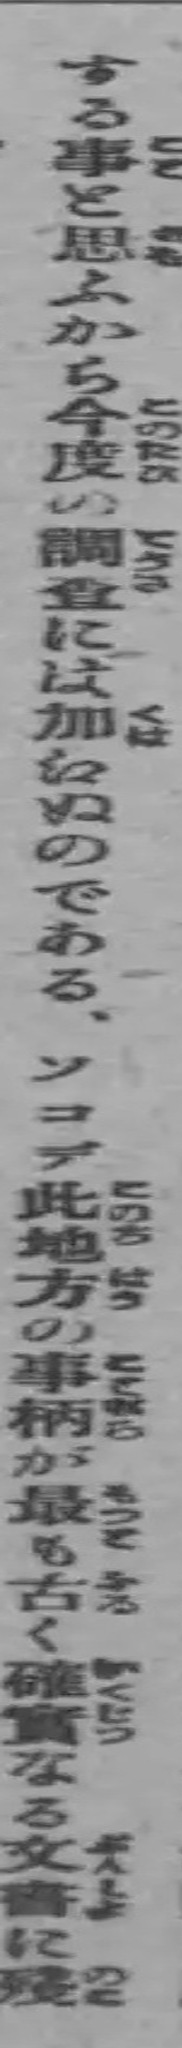する事と思ふから今度の調査には加えぬのである、ソコデ此地方の事柄が最も古く確実なる文書に残
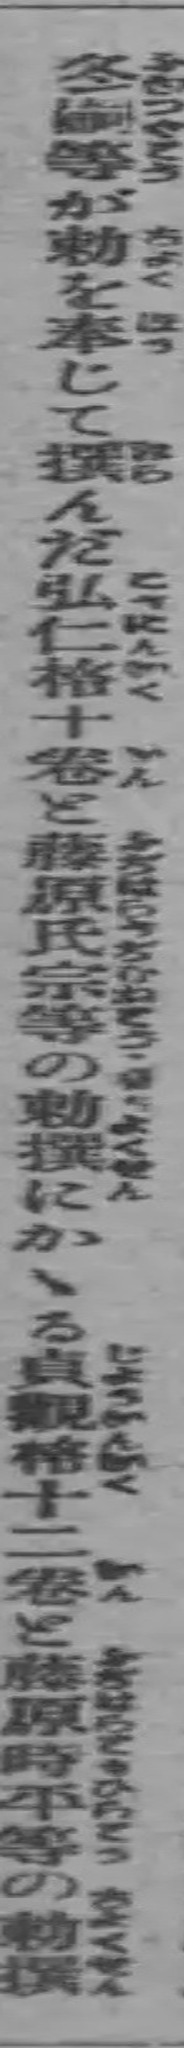橋冬嗣等が勅を奉じて撰んだ弘仁格十巻と藤原氏宗等の勅撰にかゝる貞観格十二巻と藤原時平等の勅撰

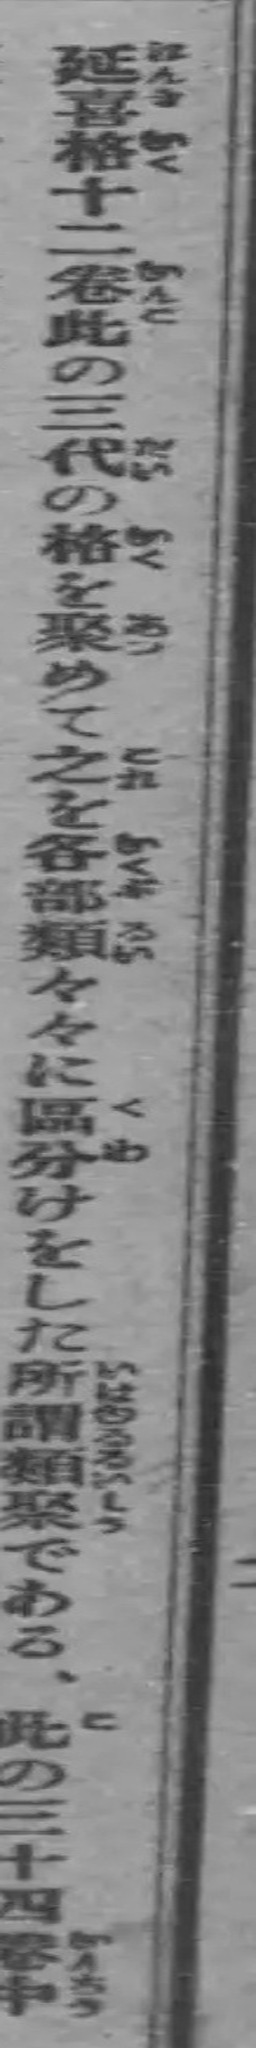延喜格十二巻此の三代の格を聚めて之を各部類々々に区分けをした所謂類聚である、此の三十四巻中
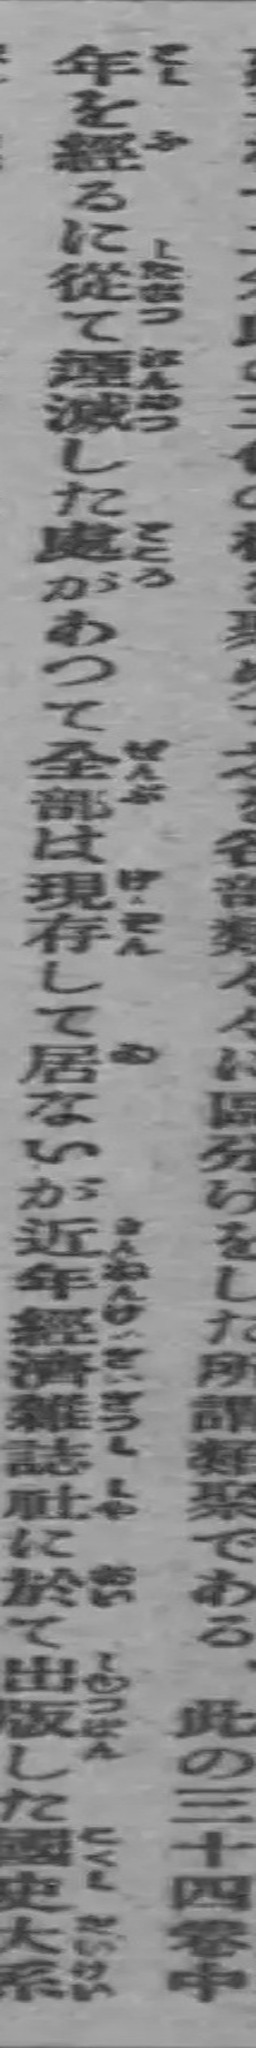年を経るに従て湮滅した処があつて全部は現存して居ないが近年経済雑誌社に於て出版した国史大系
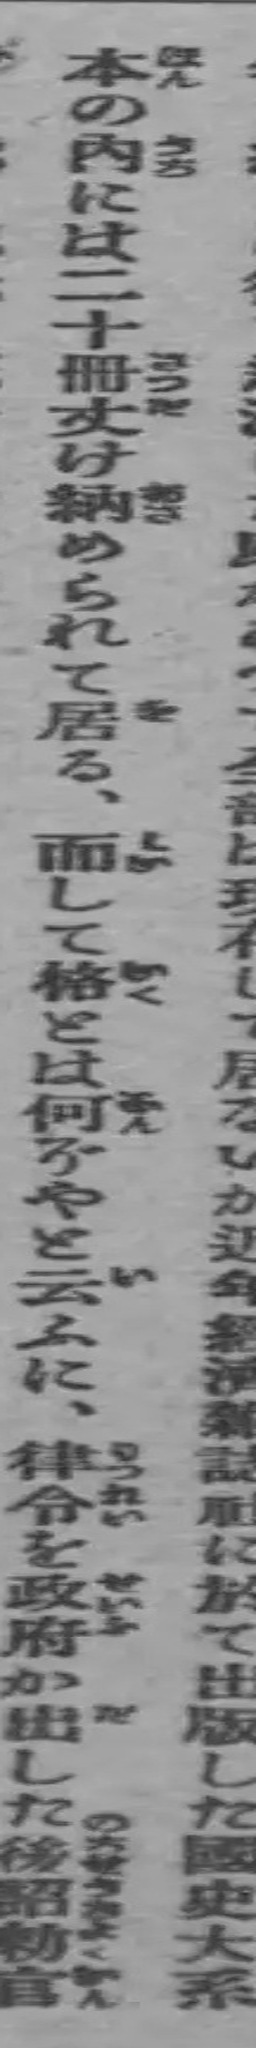本の内には二十冊丈け納められて居る、而して格とは何ぞやと云ふに、律令を政府か出した後詔勅官
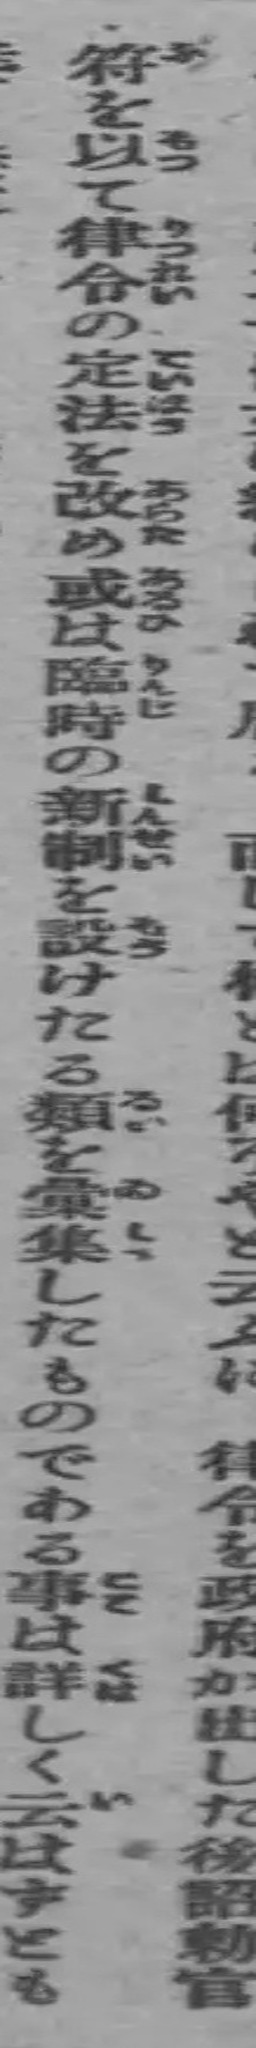符を以て律令の定法を改め或は臨時の新制を設けたる類を彙集したものである事は詳しく云はずとも
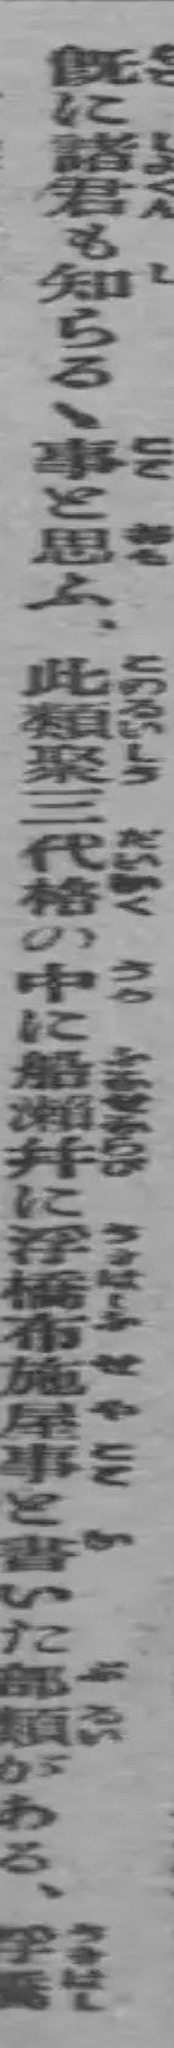既に諸君も知らるゝ事と思ふ、此類聚三代格の中に船瀬幷に浮橋布施屋事と書いた部類がある、浮橋
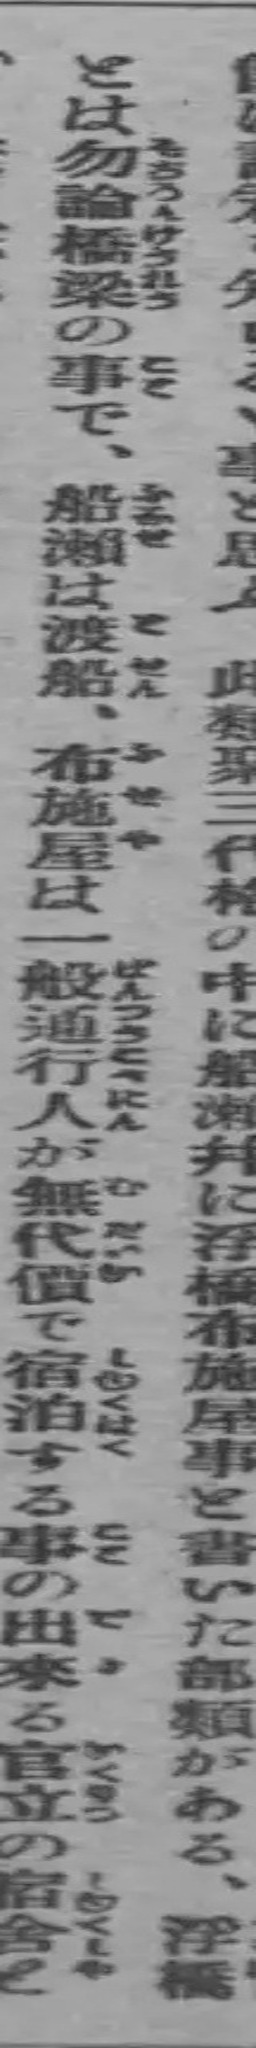とは勿論橋梁の事で、船瀬は渡船、布施屋は一般通行人が無代価で宿泊する事の出来る官立の宿舎と
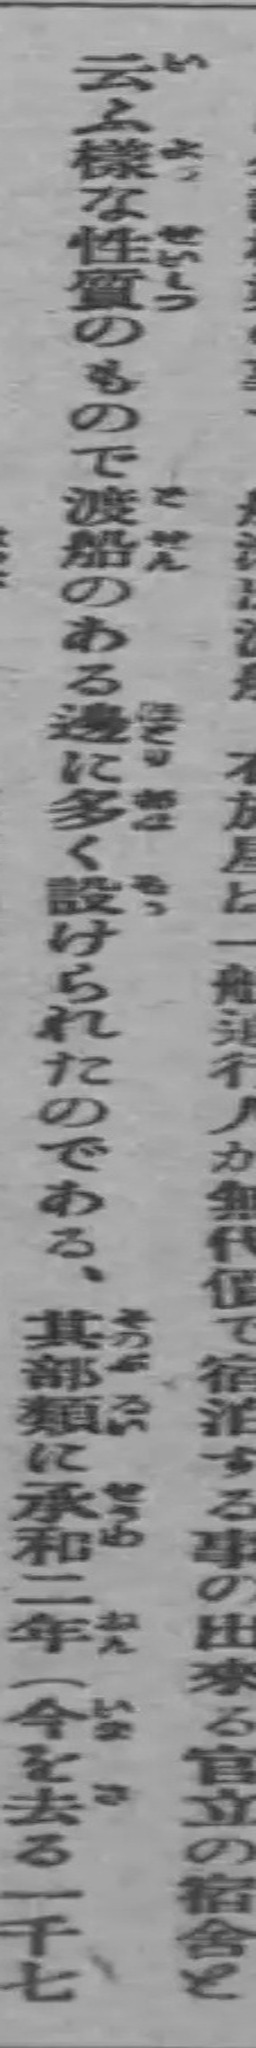云ふ様な性質のもので渡船のある辺に多く設けられたのである、其部類に承和二年(今を去る一千七
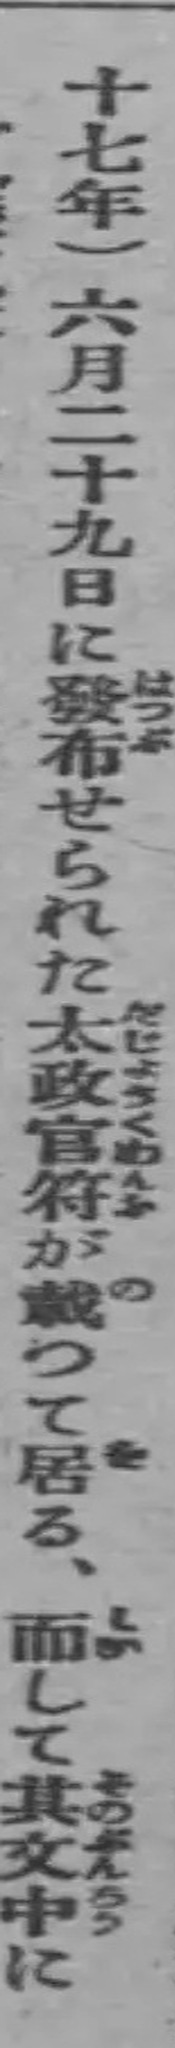十七年)六月二十九日に発布せられた太政官符が載つて居る、而して其文中に
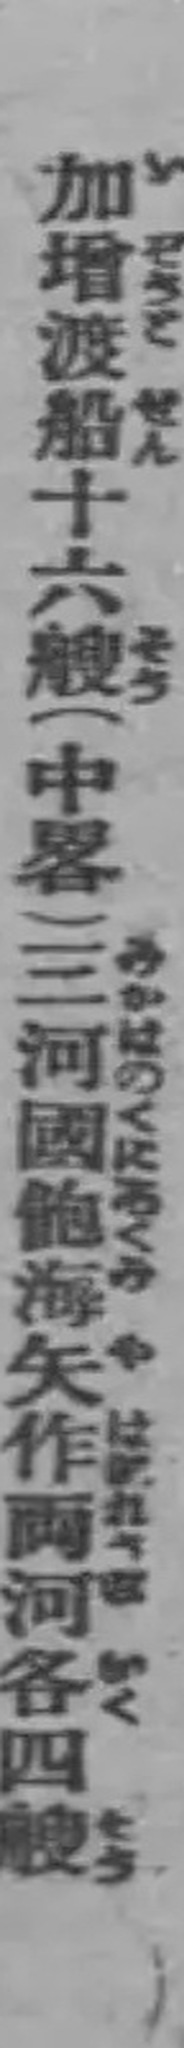加増渡船十六艘(中略)三河国飽海矢作両河各四艘
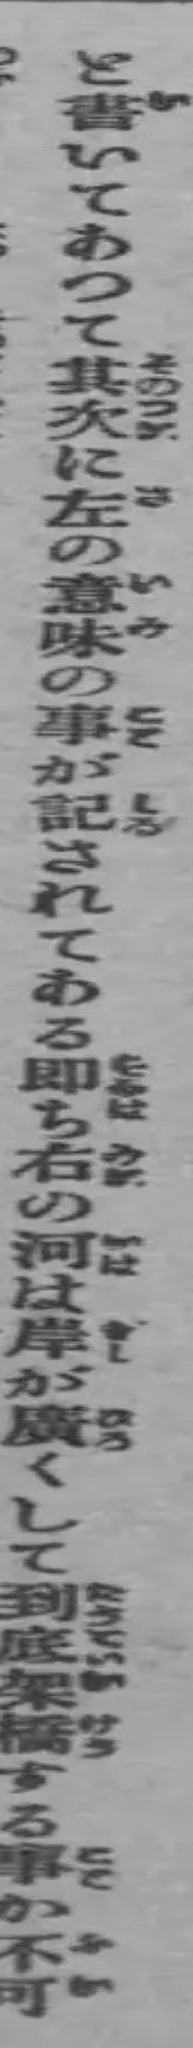と書いてあつて其次に左の意味の事が記されてある即ち右の河は岸が広くして到底架橋する事か不可
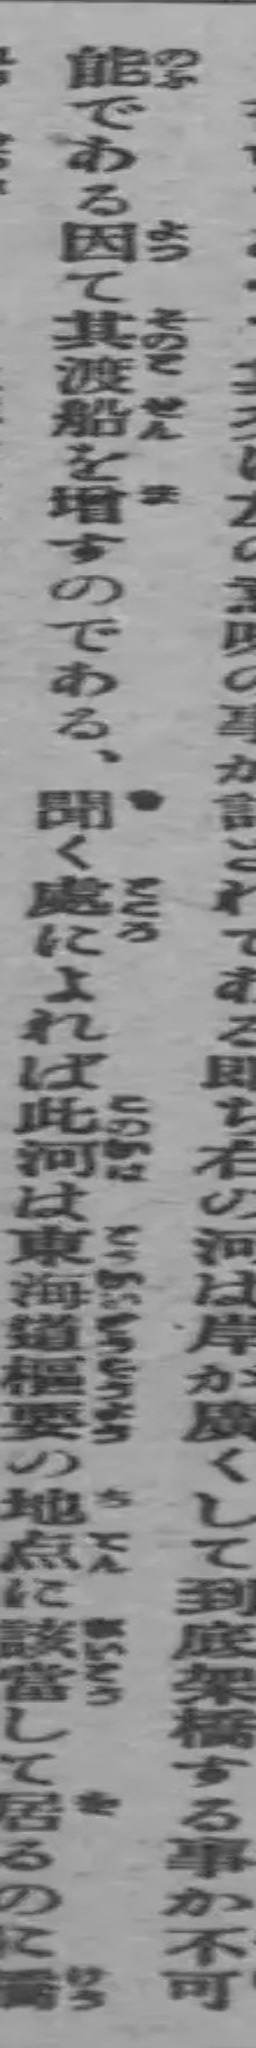能である因て其渡船を増すのである、聞く処によれば此河は東海道枢要の地点に該当して居るのに橋
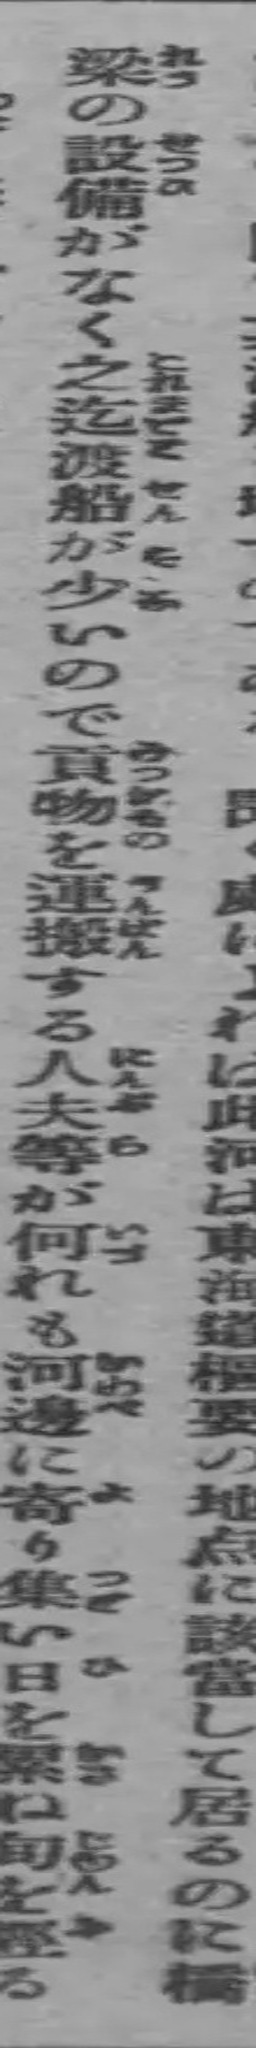梁の設備がなく之迄渡船が少いので貢物を運搬する人夫等が何れも河辺に寄り集い日を累ね旬を経る
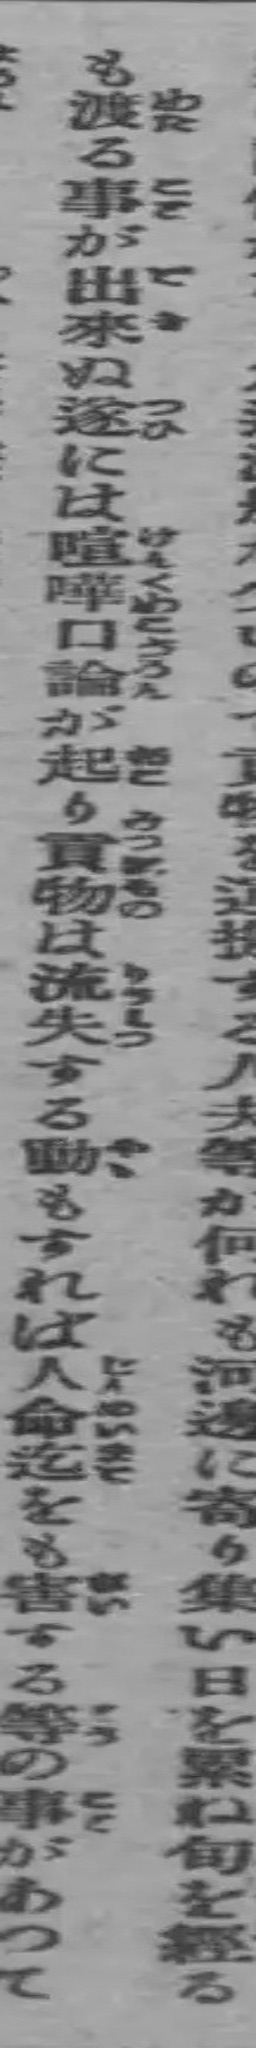も渡る事が出来ぬ遂には喧嘩口論が起り貢物は流失する動もすれば人命迄をも害する等の事があつて
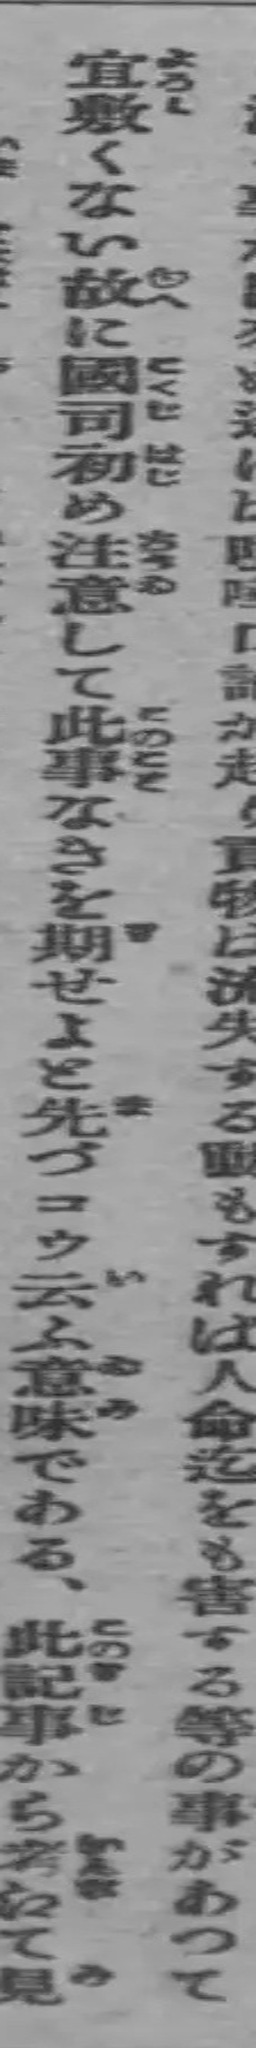宜敷くない故に国司初め注意して此事なきを期せよと先づコウ云ふ意味である、此記事から考えて見
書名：豊橋市史談
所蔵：国立国会図書館 National Diet Library, JAPAN
